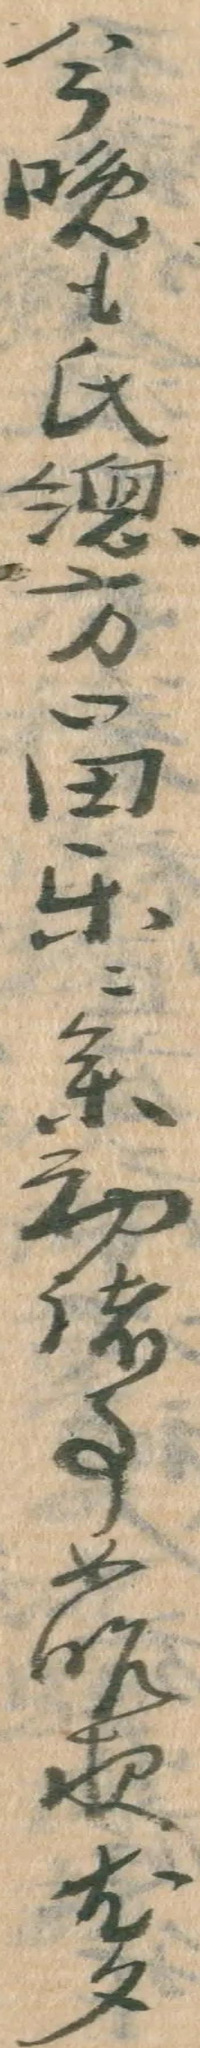今晩も氏總方御田楽に参勤、諸事如昨夜、尤夕
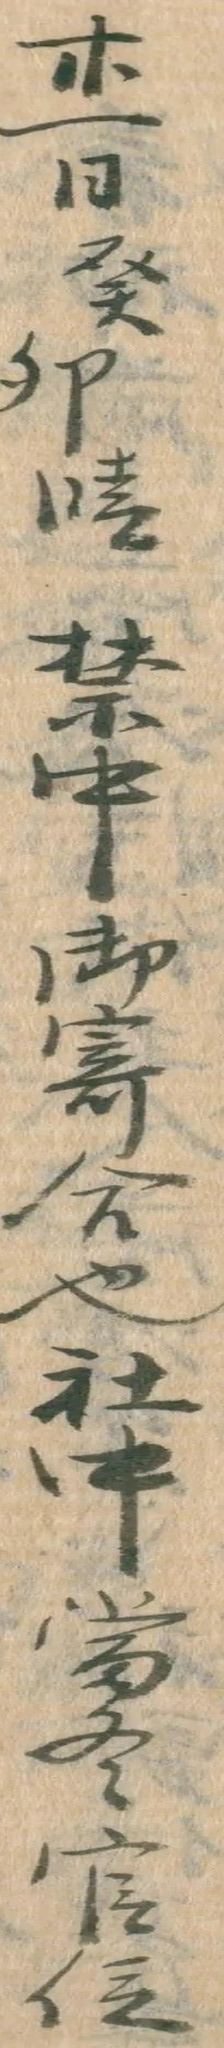廿一日癸申晴、禁中御寄合也、社中當冬官位
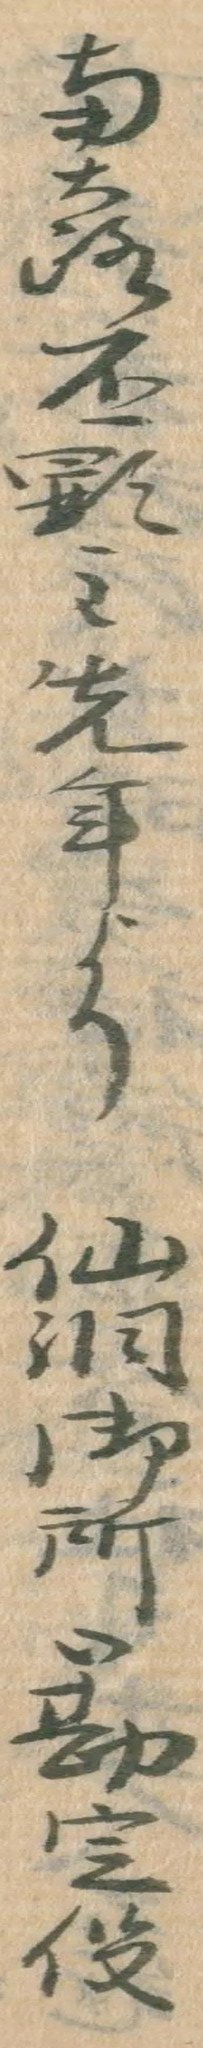南大路丕顕者、先年より仙洞御所御勘定役
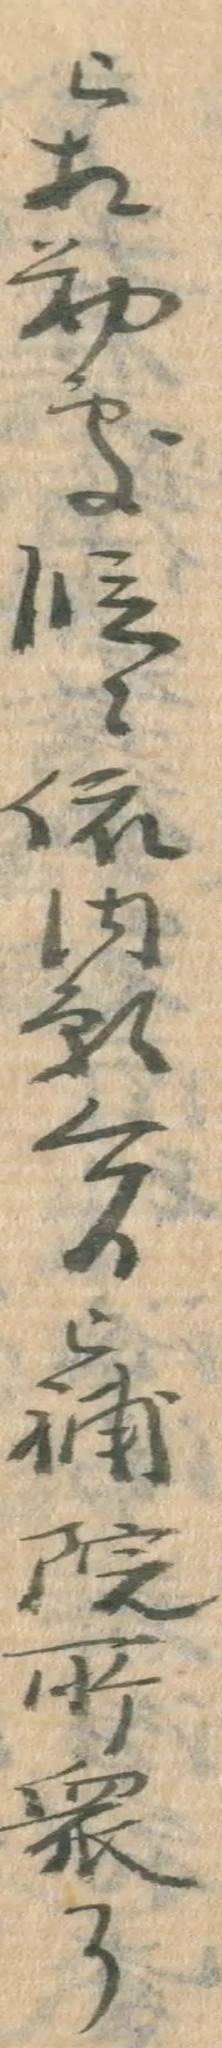被相勤處、段々依内願、今日被補院所衆了、
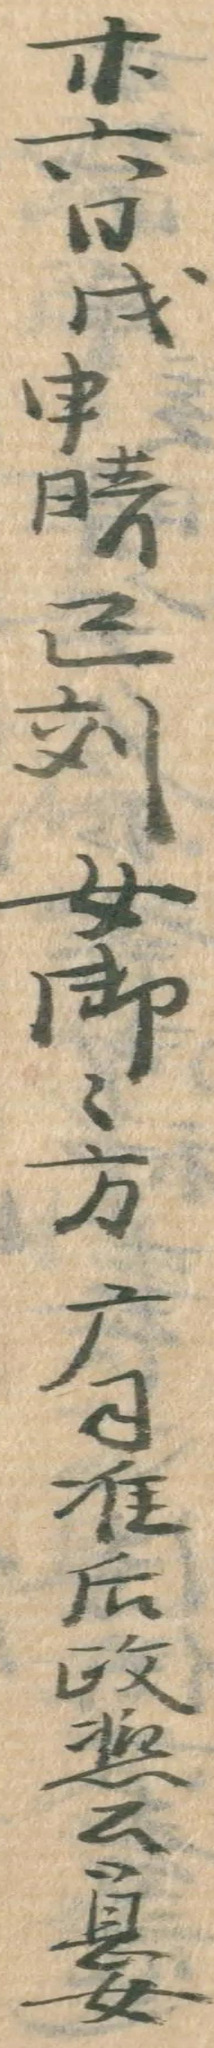廿六日戊申晴、巳刻女御〻方、鷹司准后政惣公御息女、
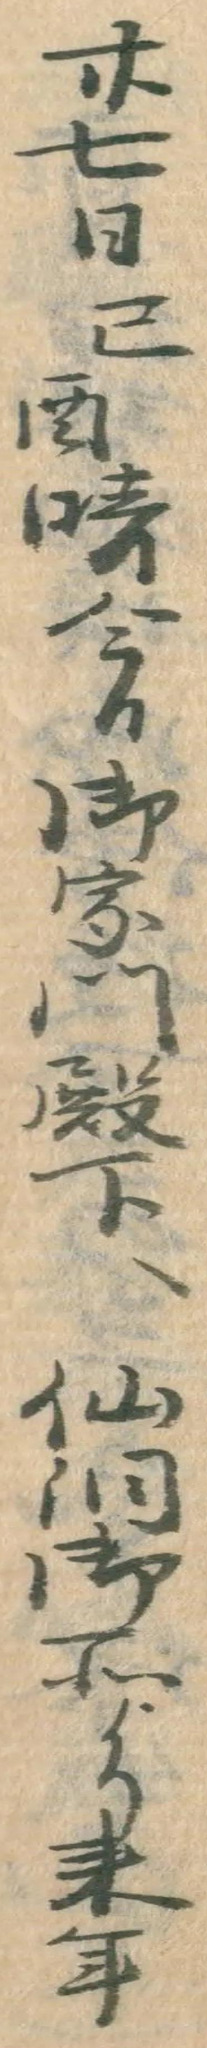廿七日己酉晴、今日御家門殿下へ仙洞御所より来年

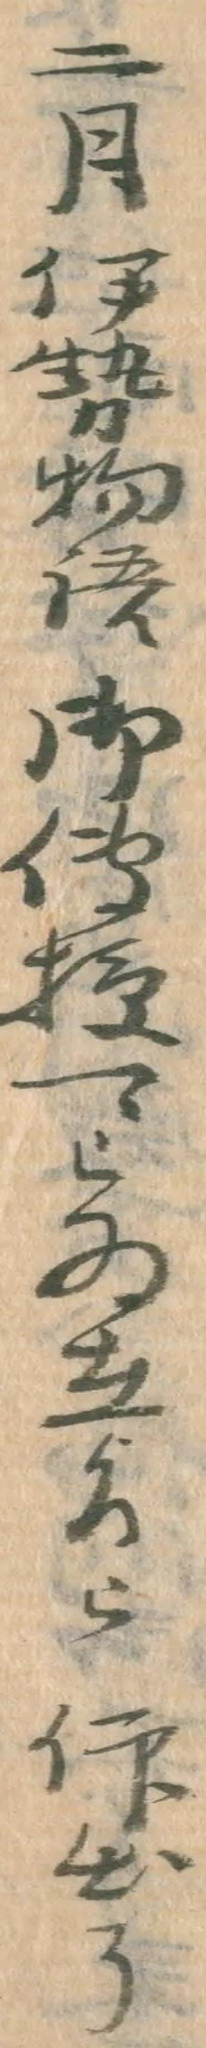二月伊勢物語御伝授可被為在旨被仰出了、
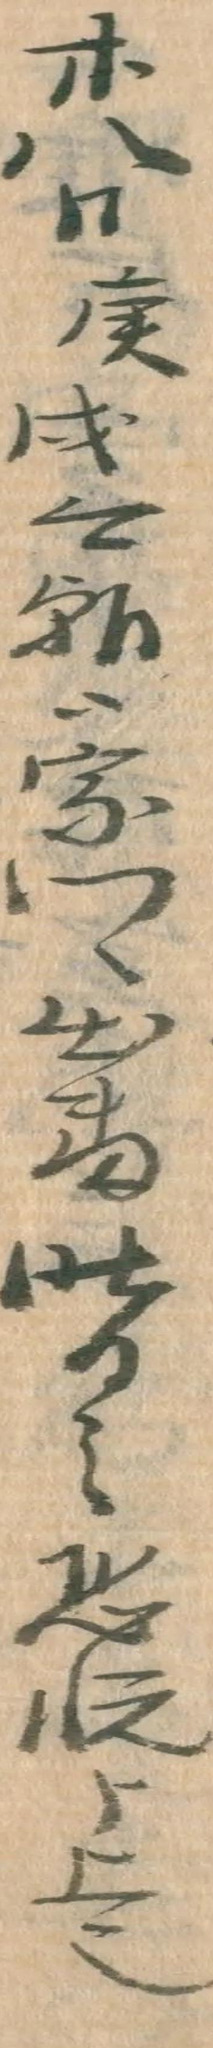廿八日庚戌、今朝御家門へ出番、昨日之恐悦申上也、
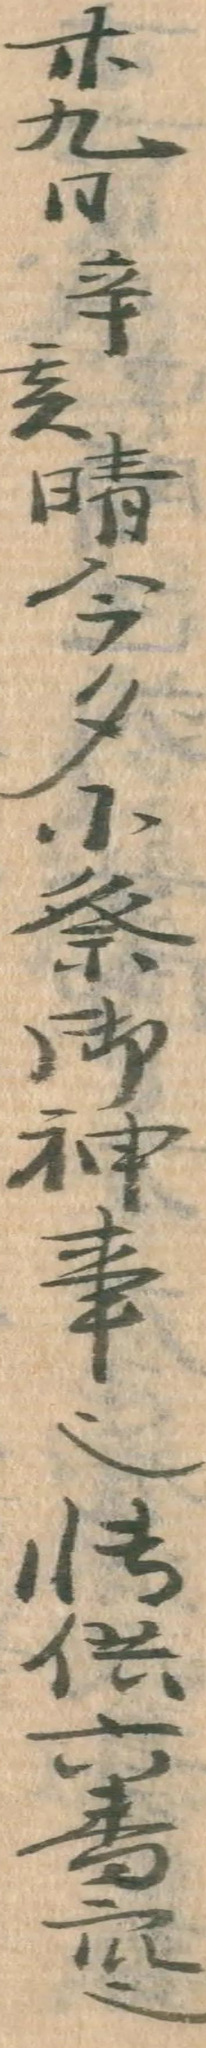廿九日辛亥晴、今夕小祭御神事也、転供六番衆也、
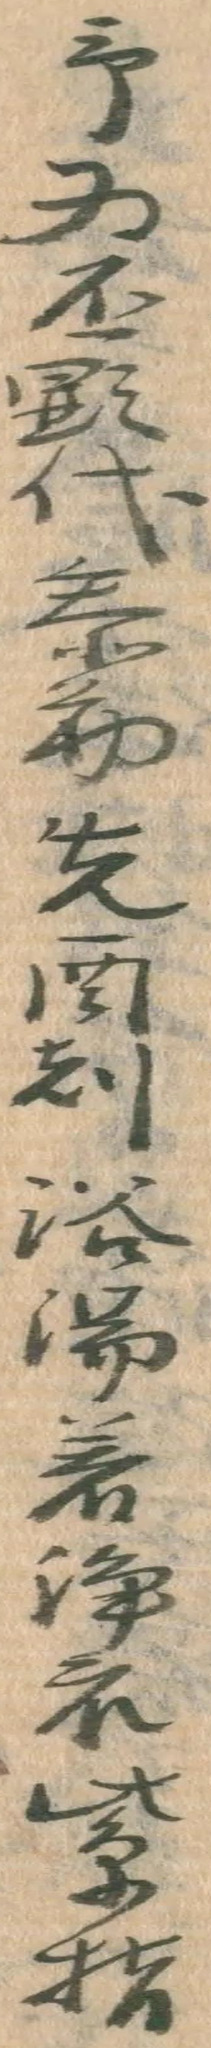予為丕顕代参勤、先酉刻浴湯、着浄衣・紫指
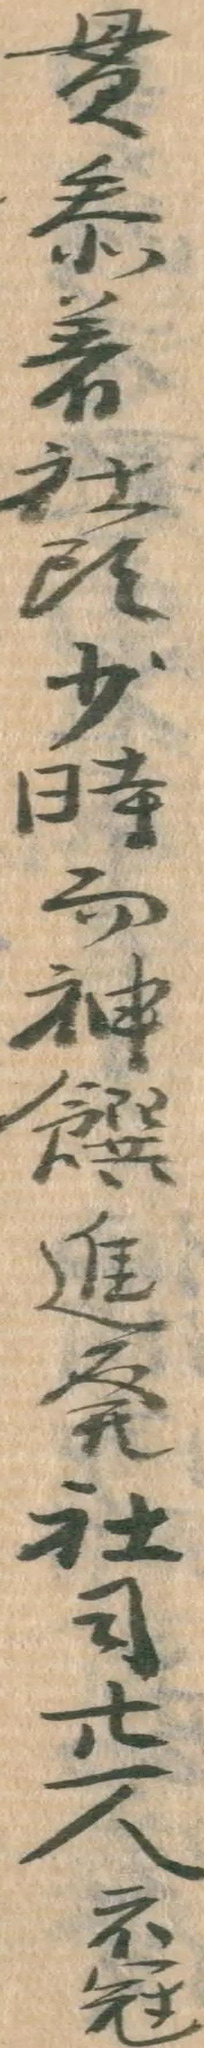貫参着、社頭少時而神進発、社司廿一人衣冠
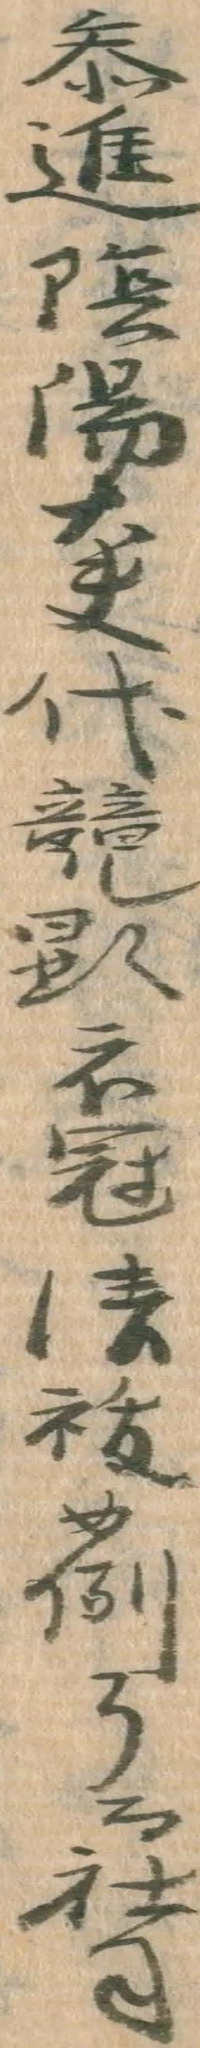参進、陰陽大夫代競顕衣冠、清祓如例了而、社司
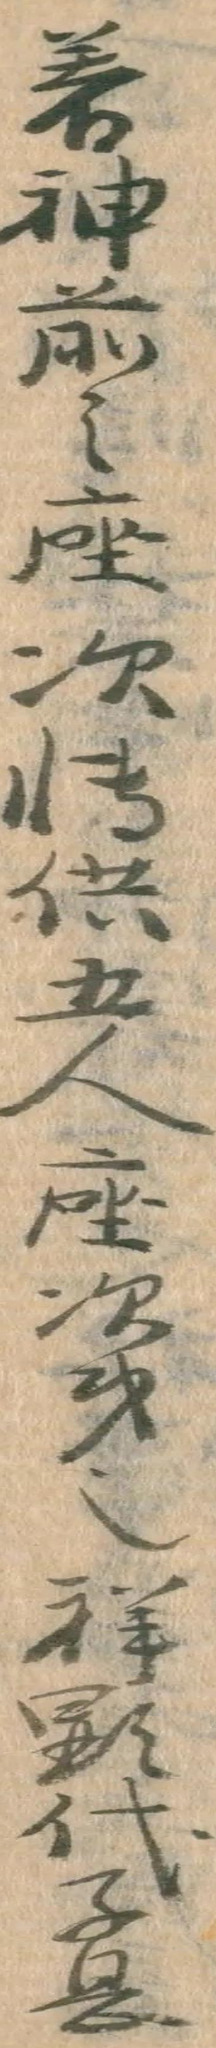着神前之座、次傳供五人、座次第也、祥顕代子息
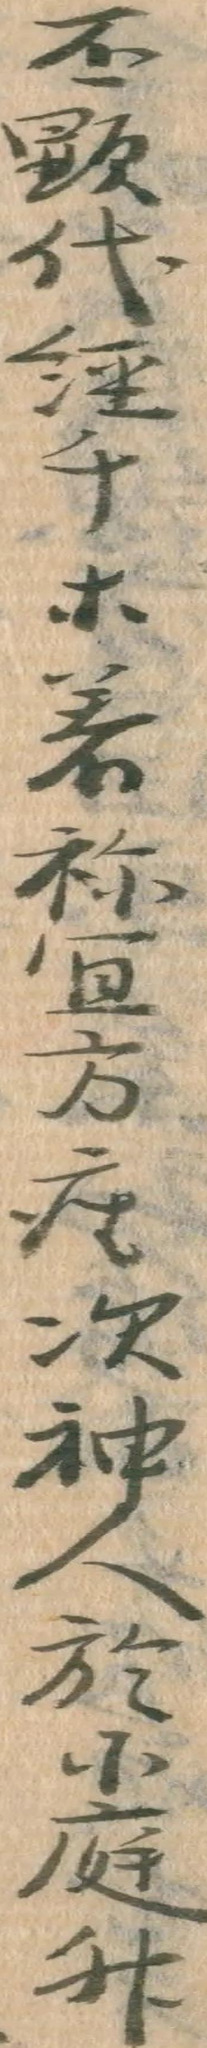丕顕代経千等着称宜方座次、神人於小庭、升
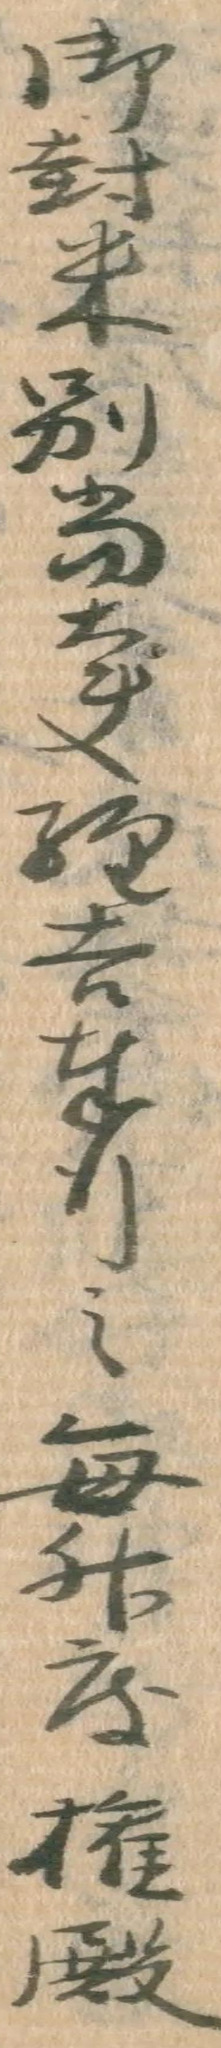御封米別当大夫経吉奉行之、毎升度、権殿
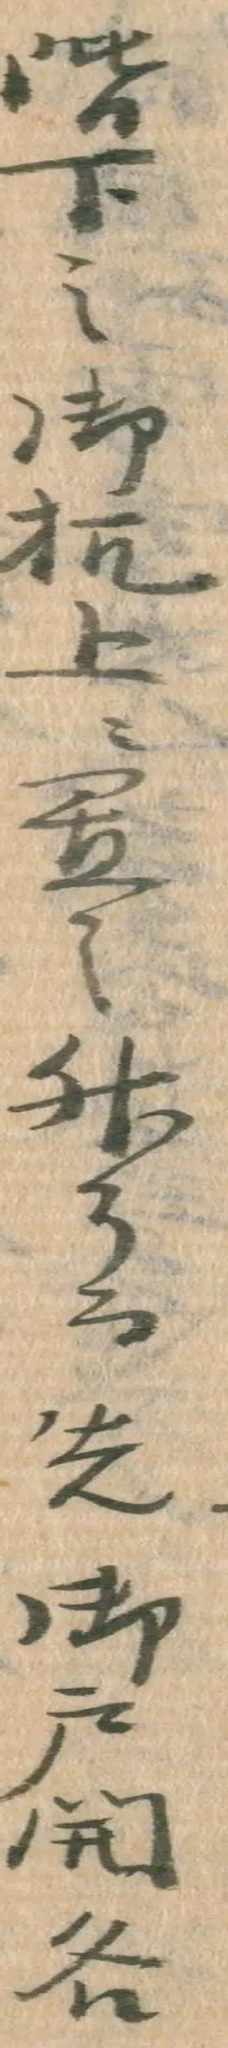階下之御杭上に置之、升了而、先御戸開、各
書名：賀茂社記録. 第63冊
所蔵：国立国会図書館 National Diet Library, JAPAN
